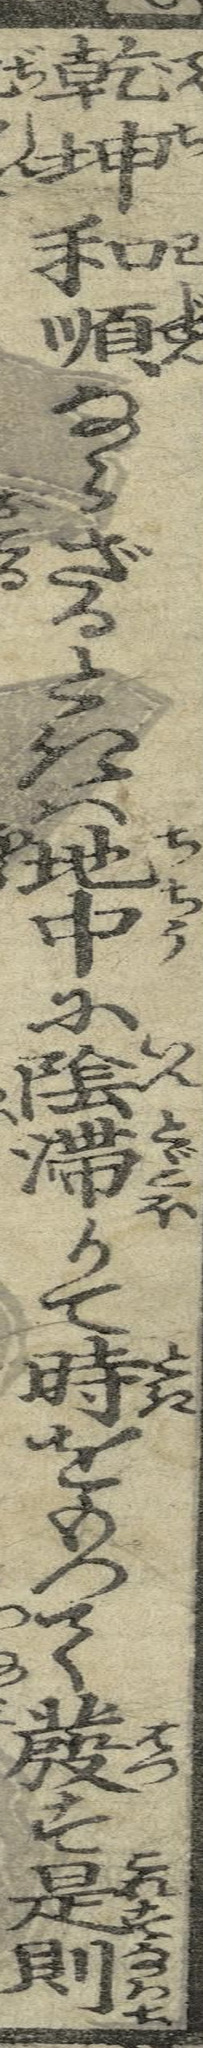乾坤和順、ならざるときハ地中に陰滞りて時をもつて發す是則
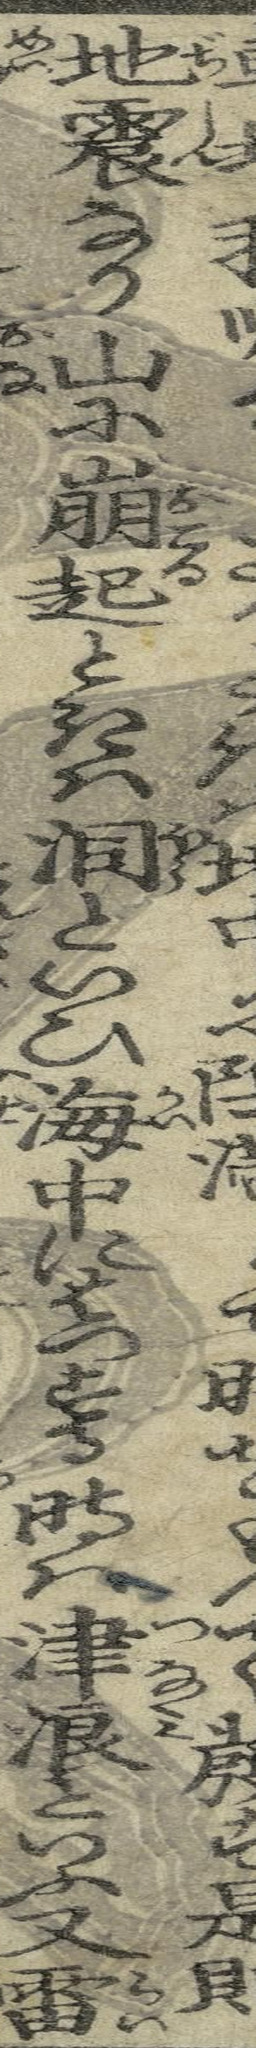地震なり山に崩起ときは洞といひ海中にはつする時は津浪といふ又雷
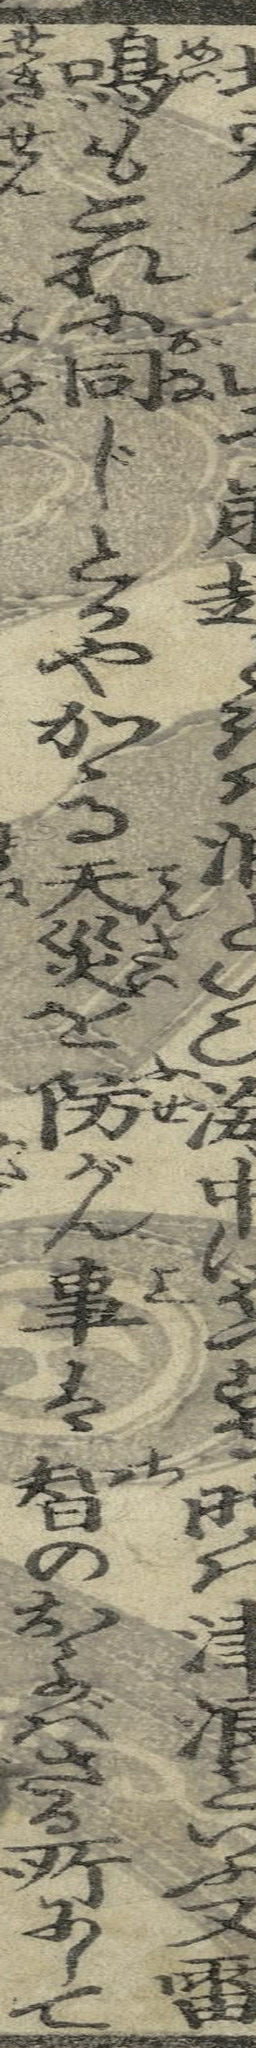鳴もこれに同じとかやかゝる天災を防がん事は智のおよばさる所にして
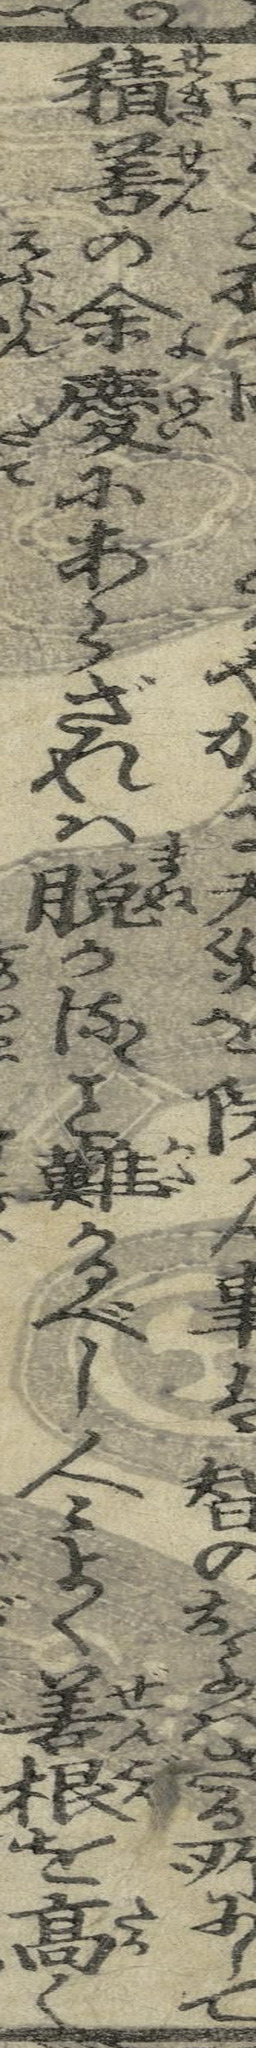積善の余慶にあらざれは脱かるゝこと難かるべし人〻よく善根を高く
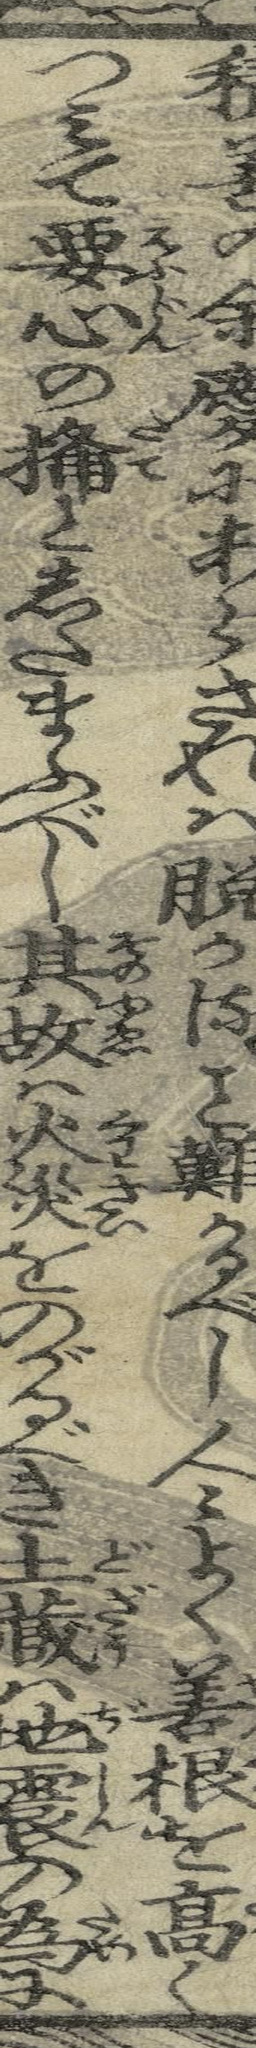つみて要心の楯としたまふべし其故は火災をのがるべき土蔵は地震の為に
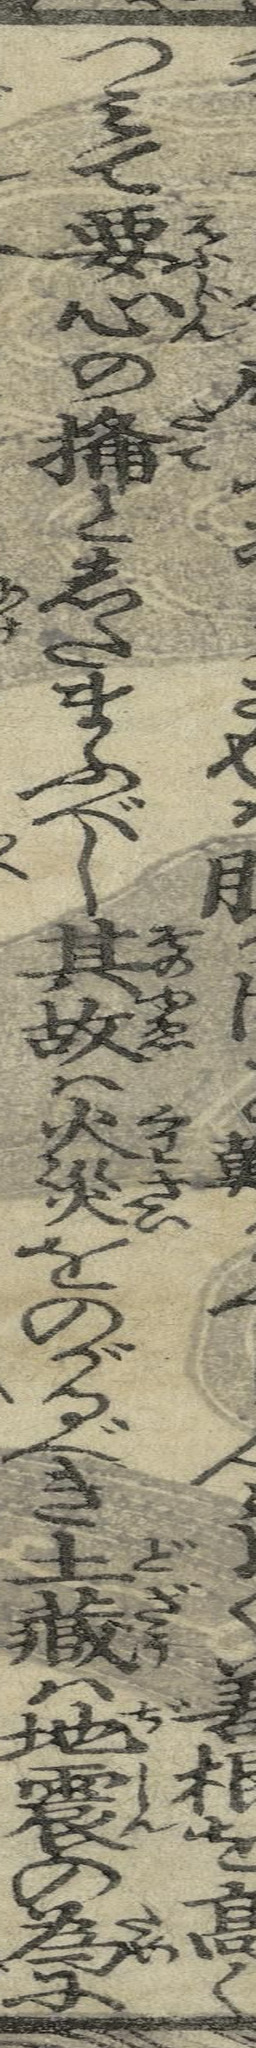つみて要心の楯としたまふべし其故は火災をのがるべき土蔵は地震の為に
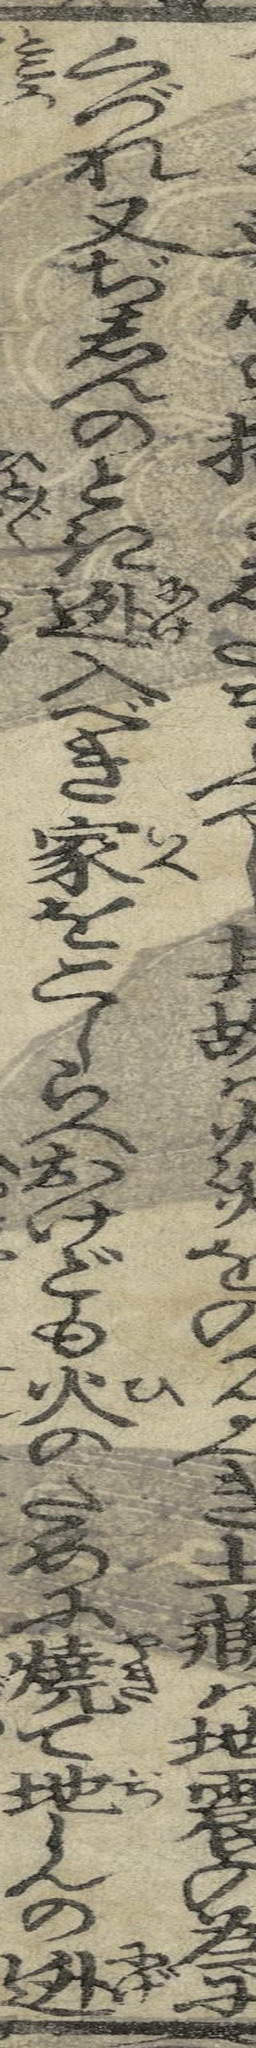くづれ又ぢしんのとき逃入べき家をこしらへおけども火のために焼て地しんの逃
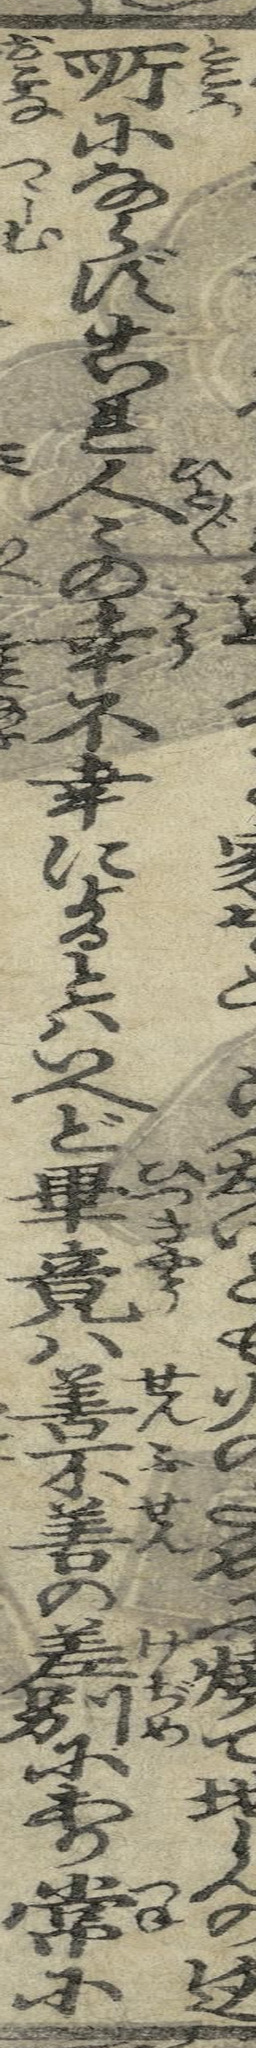所にならずこれ人々の幸不幸によるとハいへど畢竟は善不善の差別にあり常に
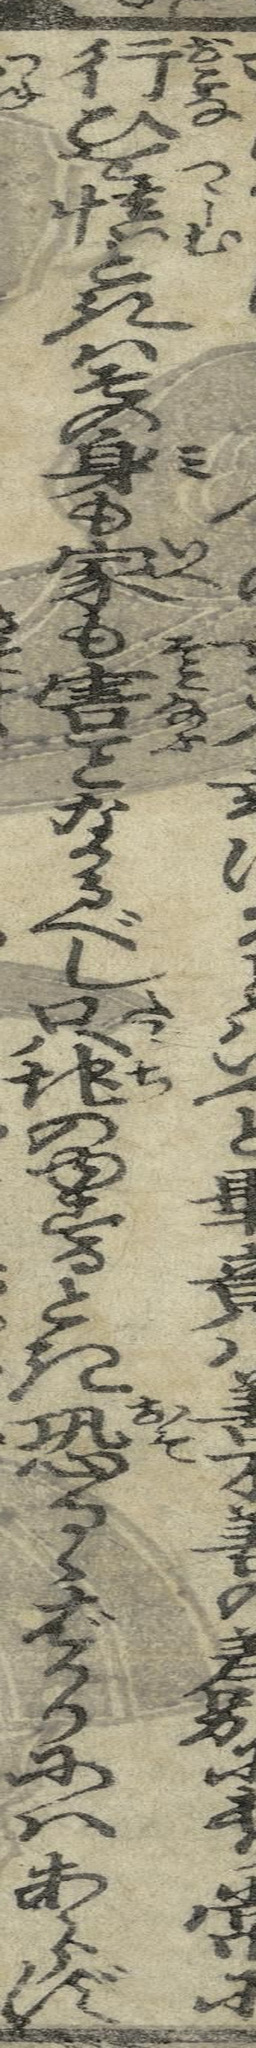行ひを慎ときはその身も家も害ことなかるべし只地のゆれるとき恐るゝばかりにハあらず
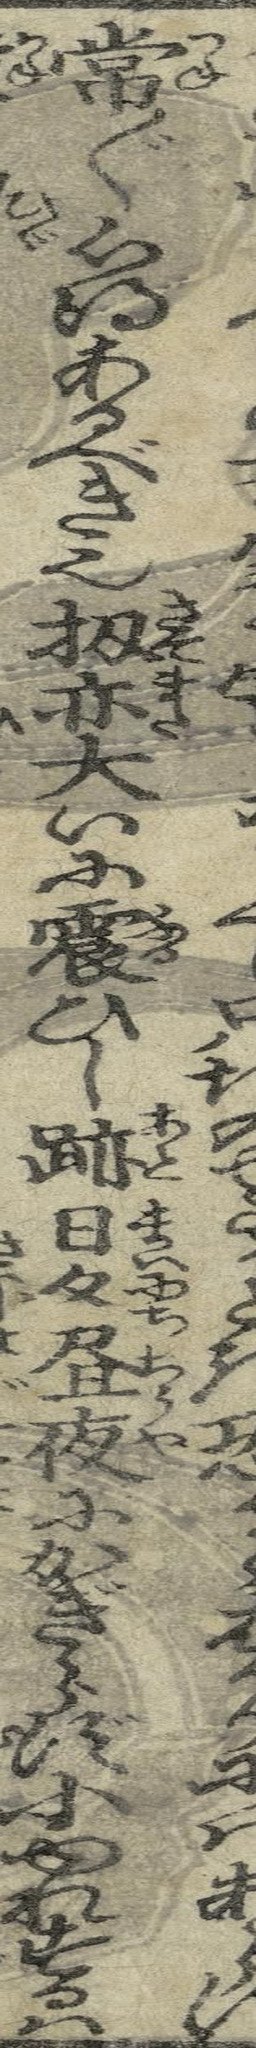常〲心得あるべき也扨亦大いに震ひし跡日々昼夜にかぎらず小ゆれするハ
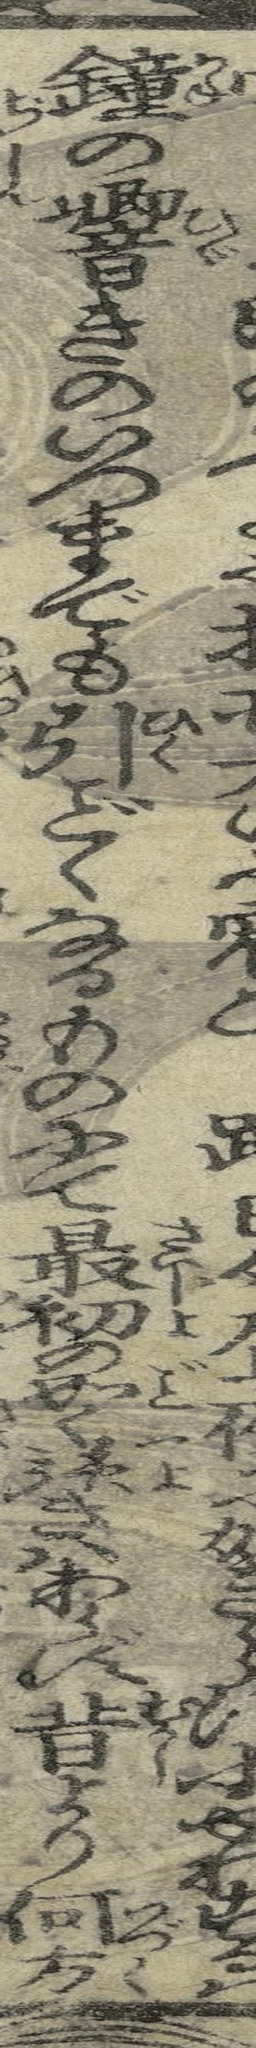鐘の響きのいつまでも引ごとくなるものにて最初の如く強きはあらず昔より何方
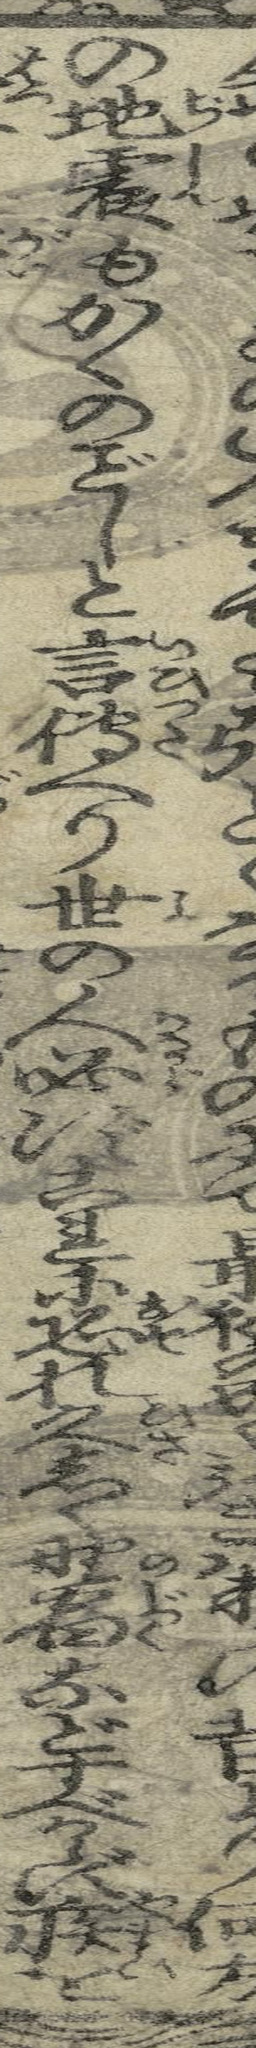の地震もかくのごとしと言伝へり世の人必ずこれに恐れ久しく野宿などすべからず疾を
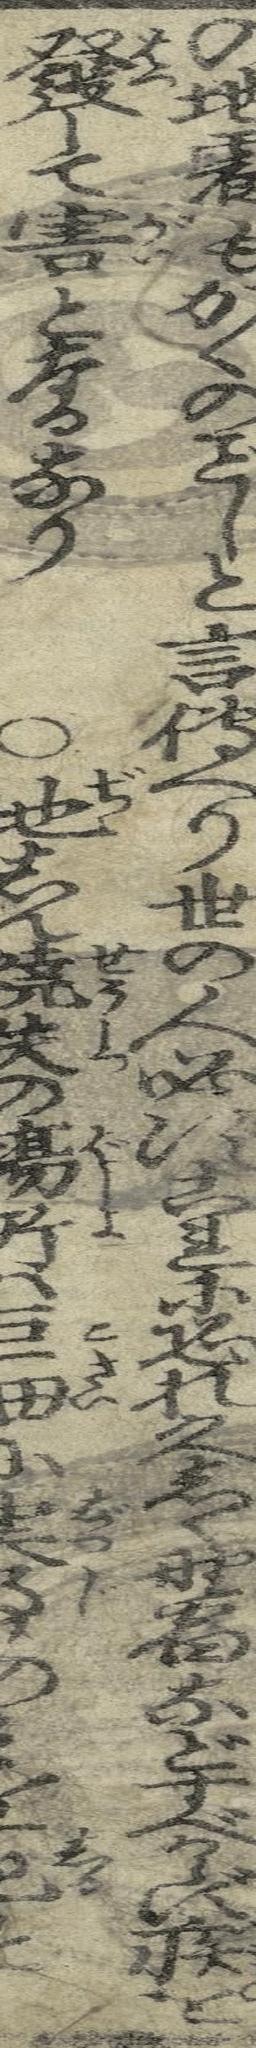発して害となるなり○地しん焼失の場所ハ巨細に実事のミを記す
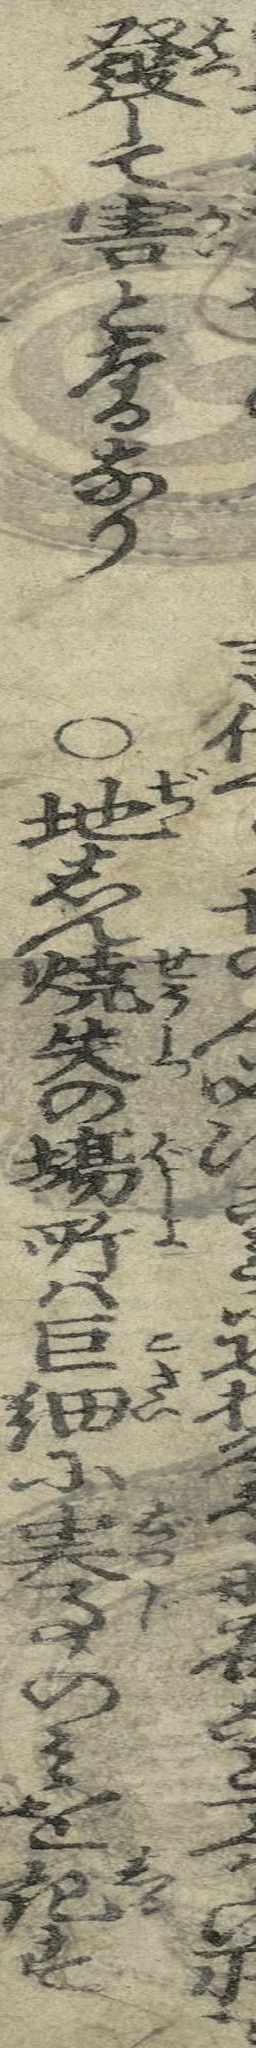発して害となるなり○地しん焼失の場所ハ巨細に実事のミを記す

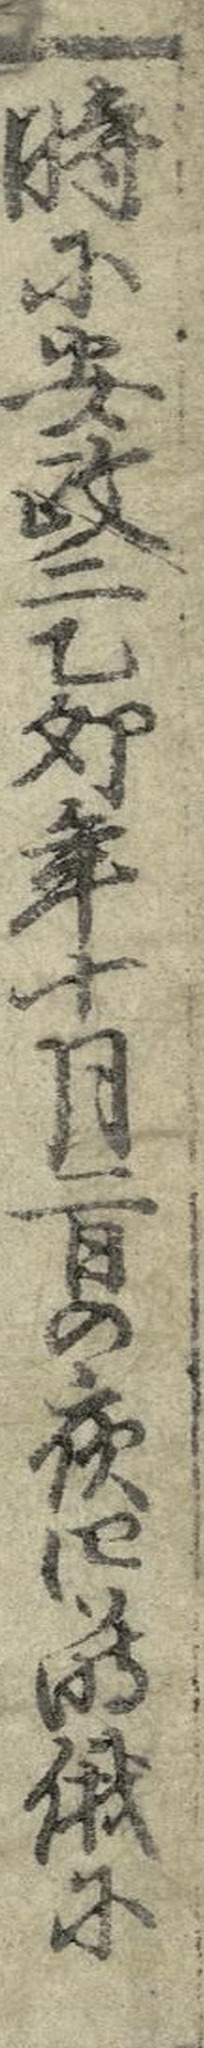時に安政二乙卯年十月二日の夜四ッ時俄に
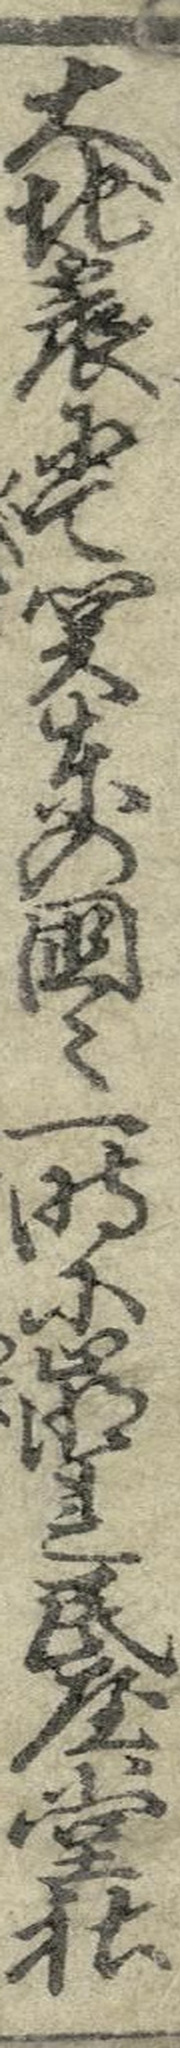大地震にて関東の国々一時に崩れ民屋堂社
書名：地震並出火細見記
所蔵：東京大学地震研究所図書室 Earthquake Research Institute Library, The University of Tokyo, JAPAN
